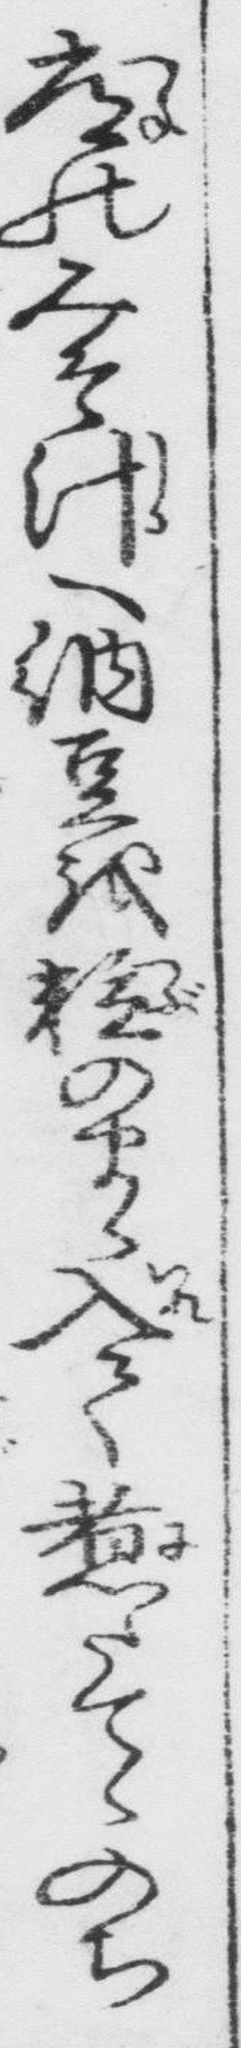常のみそ汁へ納豆を粒のまゝ入て煮立てゝのち
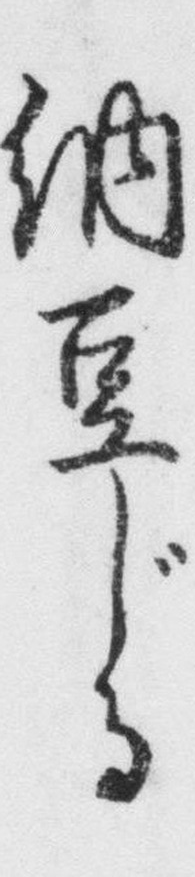納豆じる
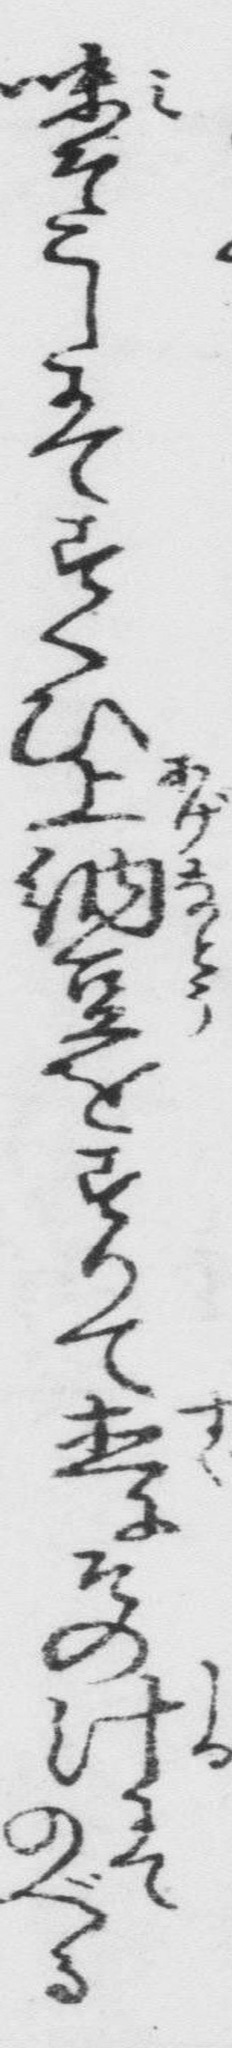味そこしにてすくひ上納豆をすりて直にその汁にてのべる
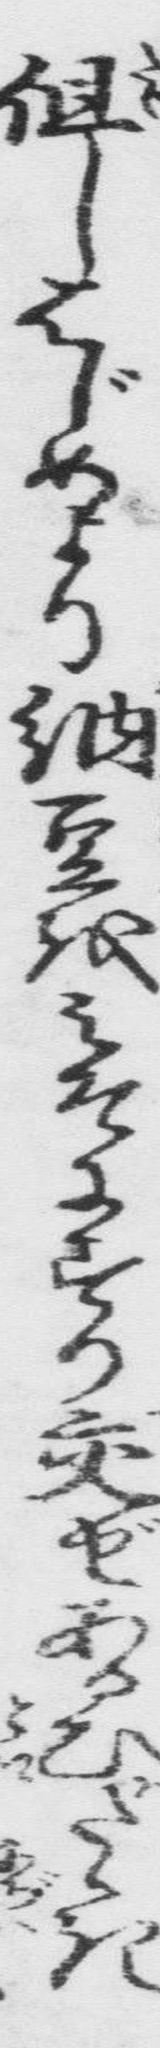但しはじめより納豆をみそにすり交ぜあるひはたゝき
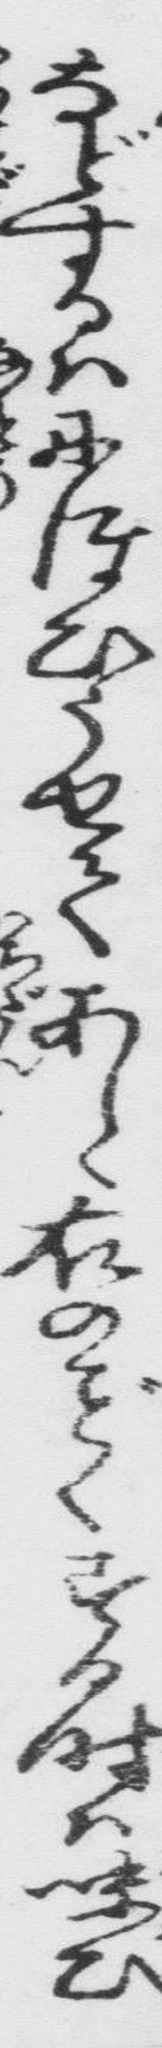などするはにほひうせてあしゝ右ごとくする時は味ひ
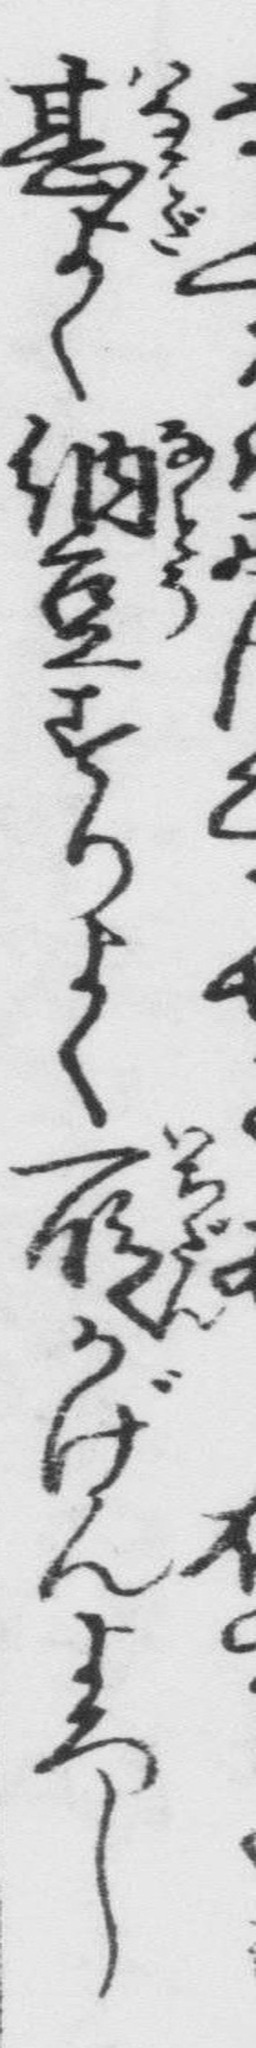甚よく納豆すりよく一段かげんよろし
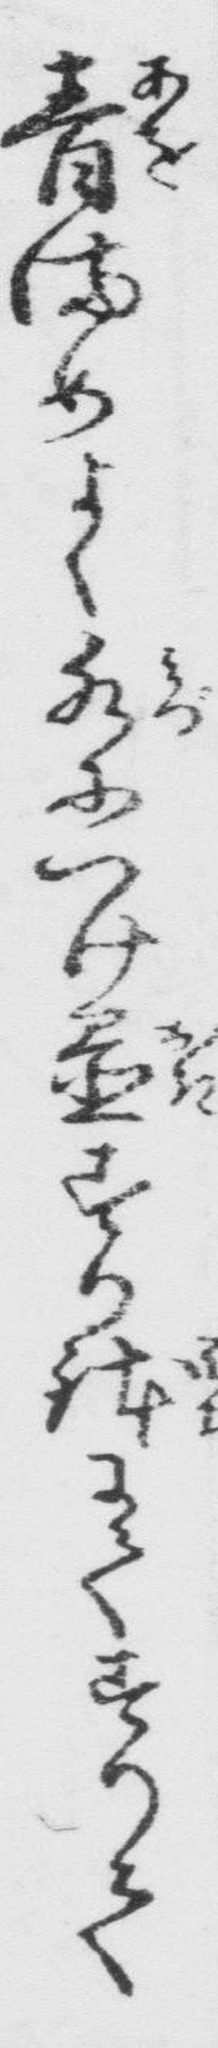青まめよく水につけ置すり鉢にてすりて
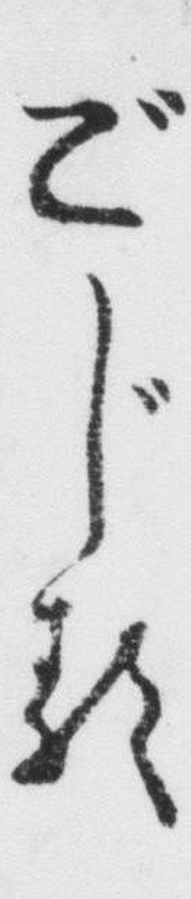ごじる
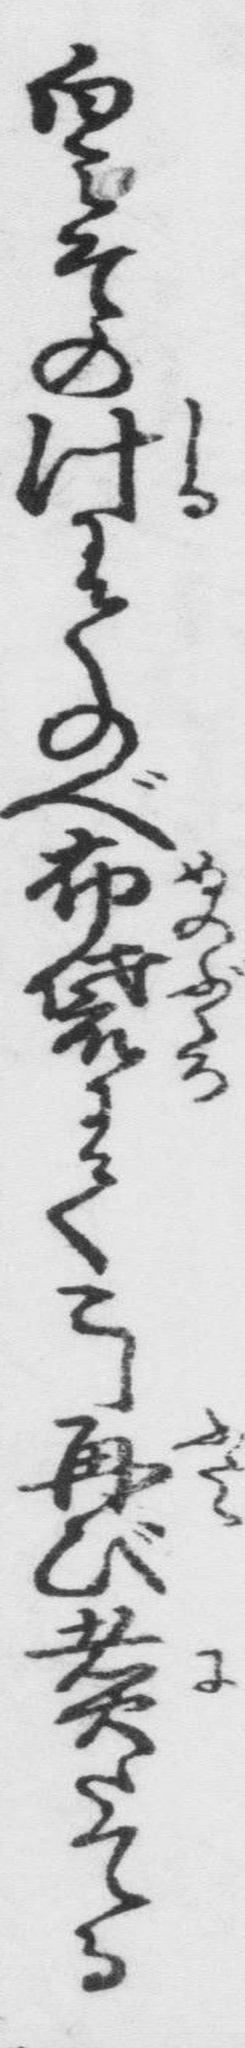白みその汁にてのべ布袋にてこし再び煮たてる
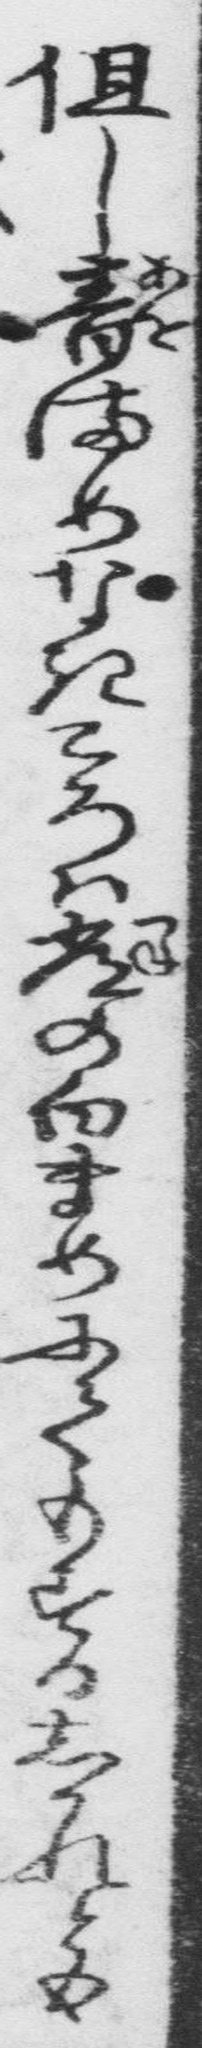但し青まめまきころは常の白まめにてもするしかれとも
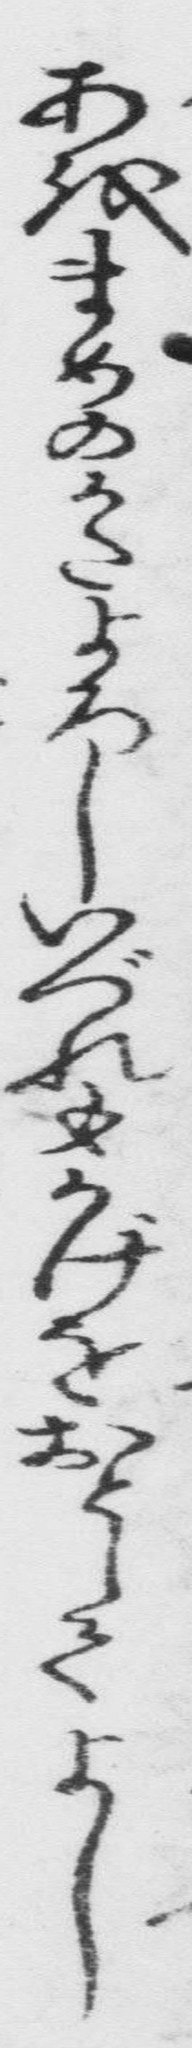あをまめのかたよろしいづれもかげをおとしてよし
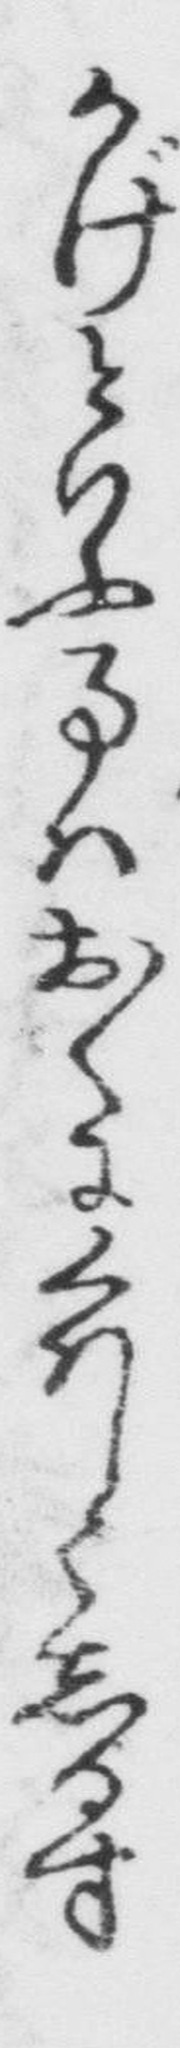かげといふ事はおくにくはしくしるす
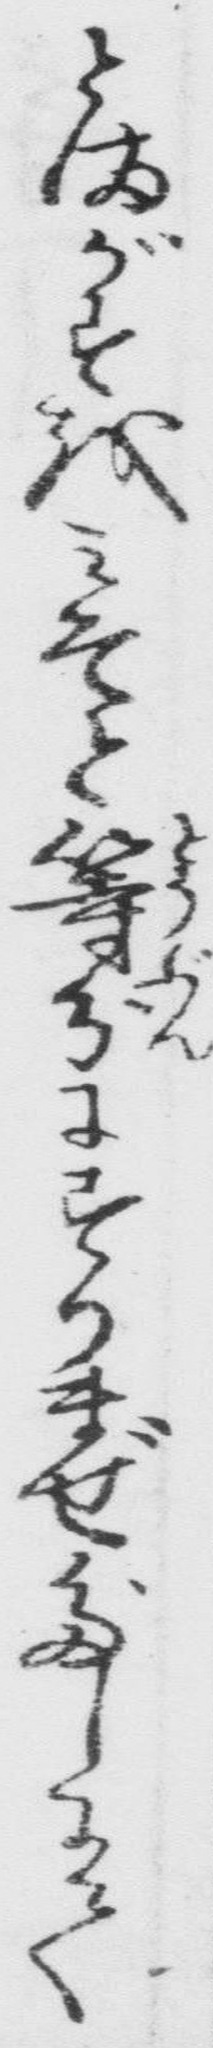とまがすをみそと等分にすりまぜだしにて
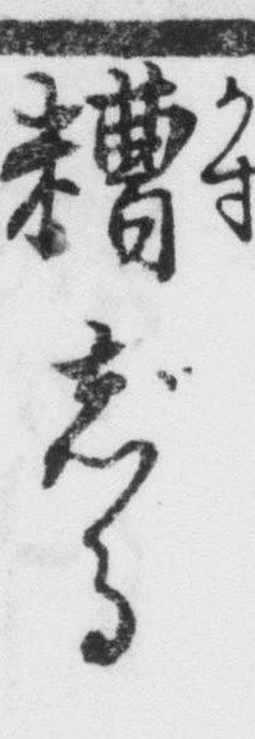糟じる
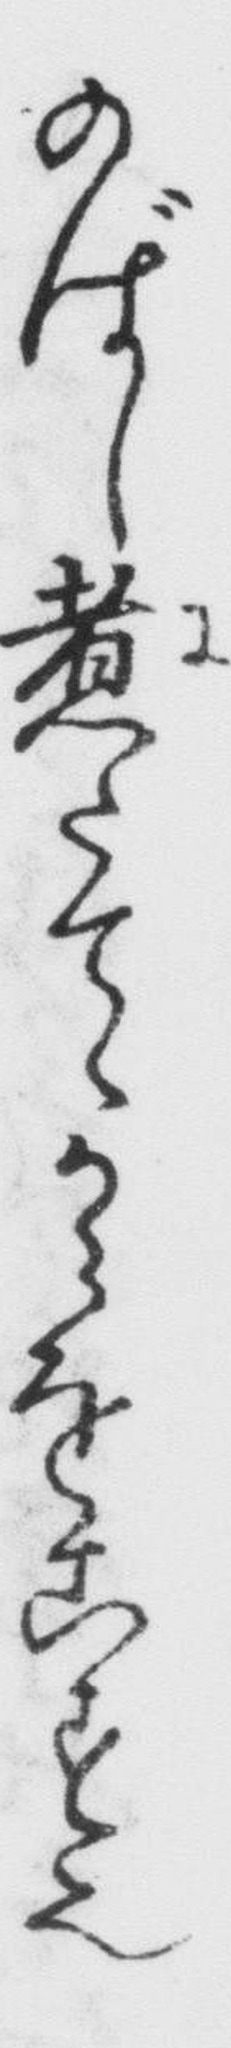のばし煮たてゝからをこす也
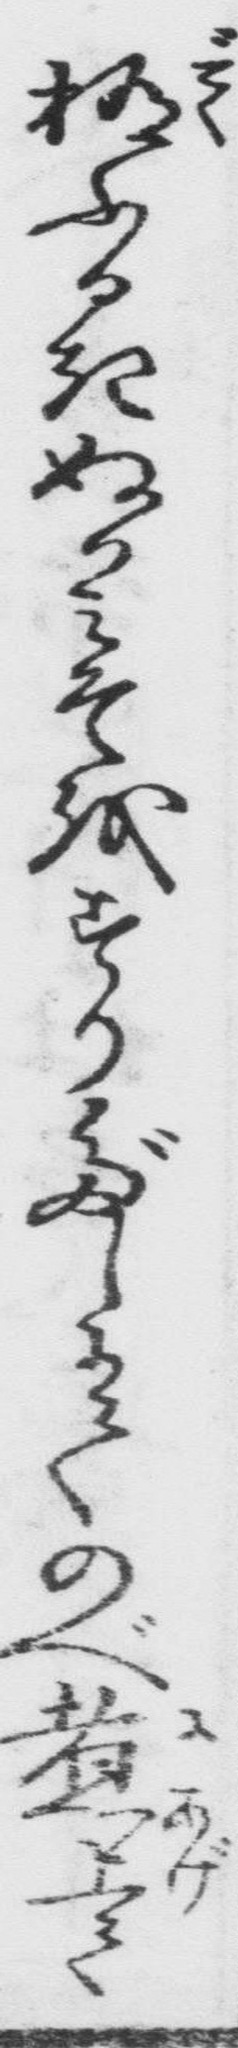極ふるきぬかみそをすりだしにてのべ煮上て
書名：料理早指南
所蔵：大阪府立大学学術情報センター 国文学研究資料館
